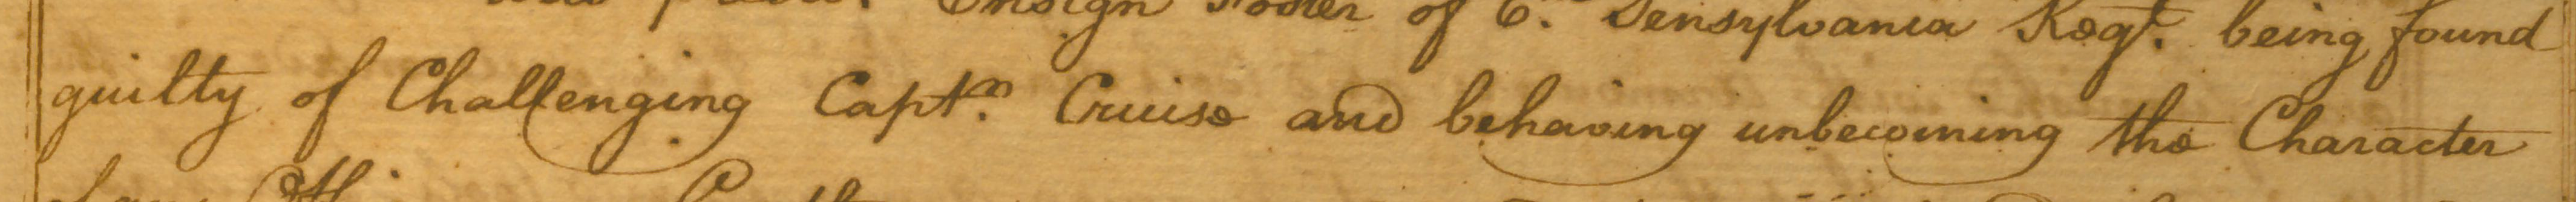guilty of Challenging Capt^tn. Cruise and behaving unbecoming the Character
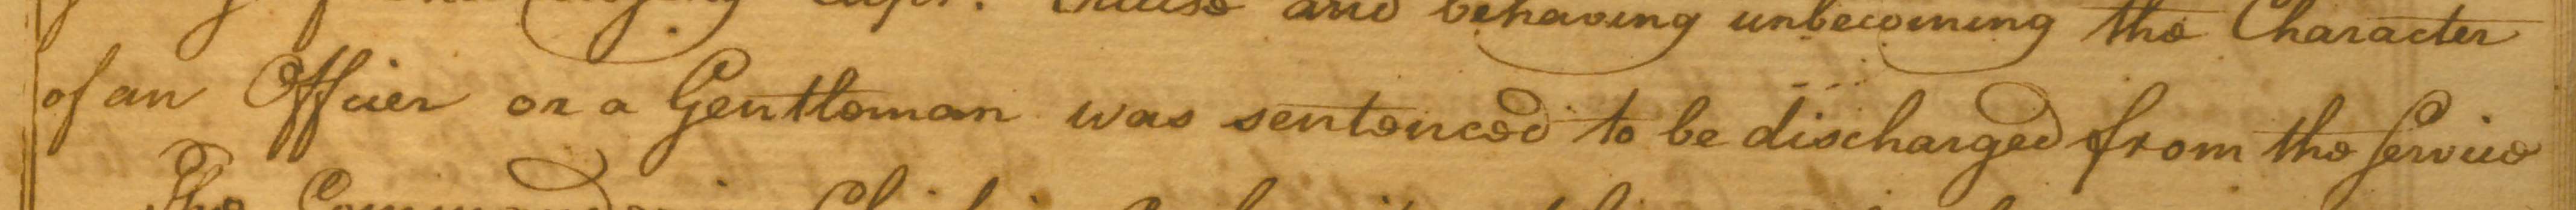of an Officer or a Gentleman was sentenced to be discharged from the service
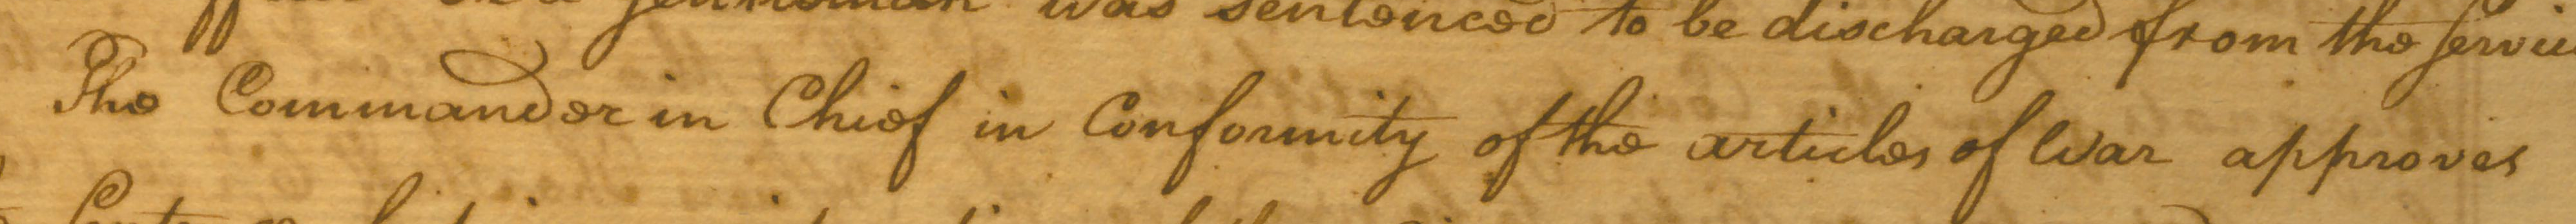The Commander in Chief in Conformity of the articles of war approves
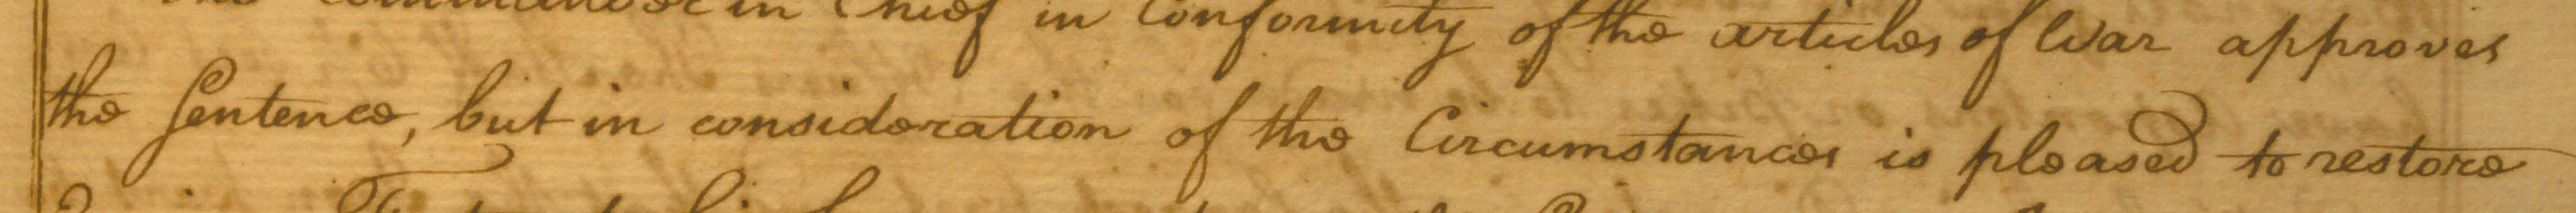the sentence, but in consideration of the Circumstances is pleased to restore
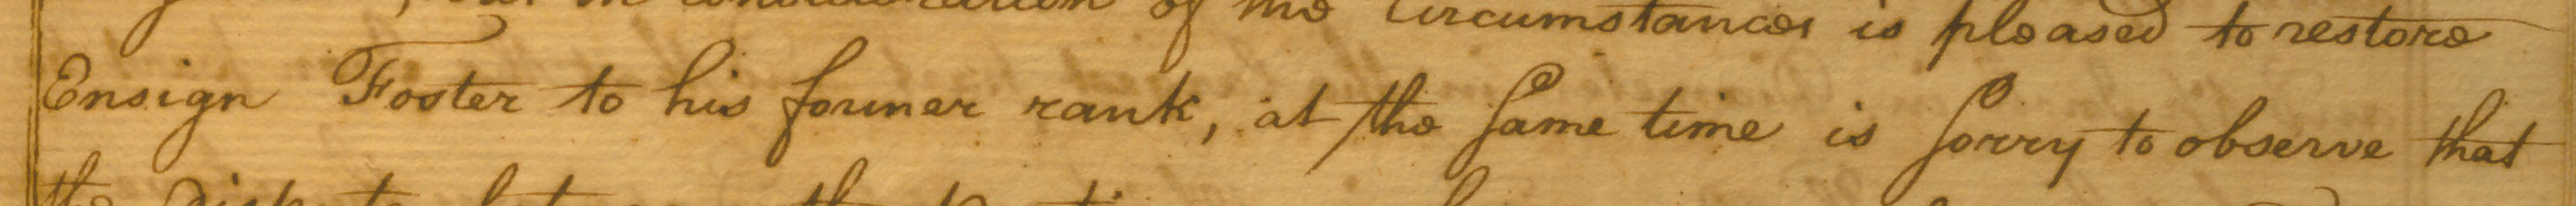Ensign Foster to his former rank, at the same time is sorry to observe that
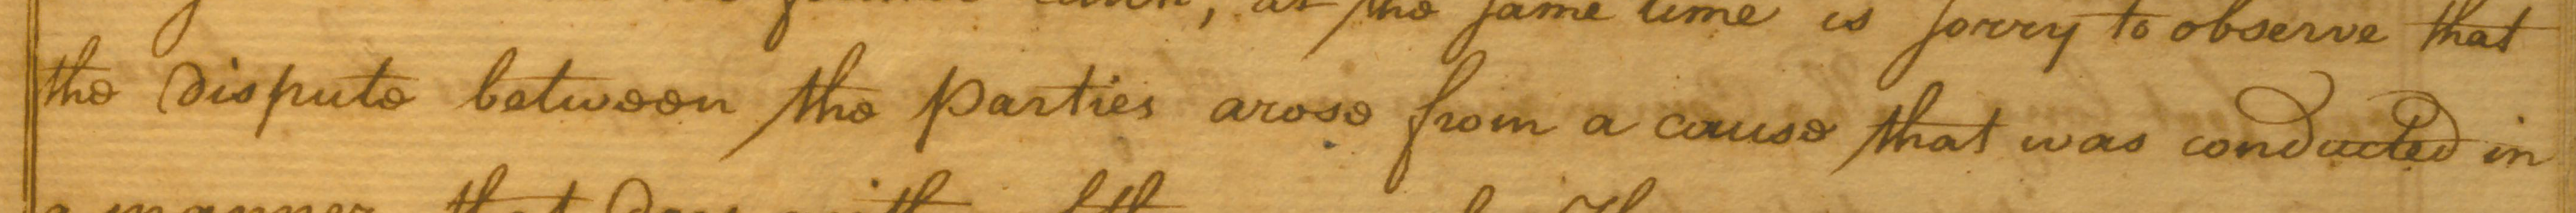the dispute between the parties arose from a cause that was conducted in
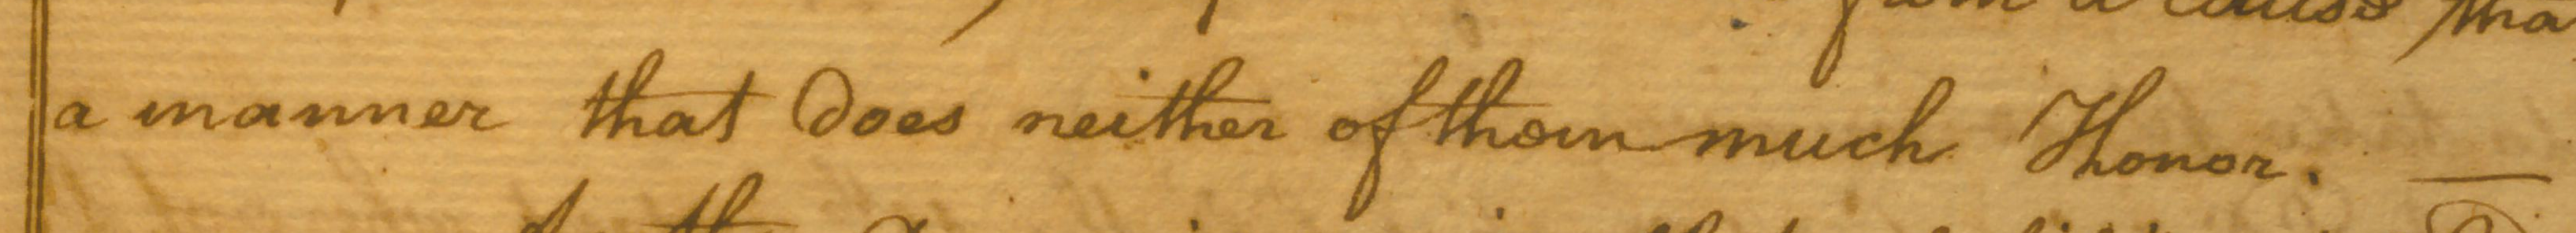a manner that does neither of them much Honor.-
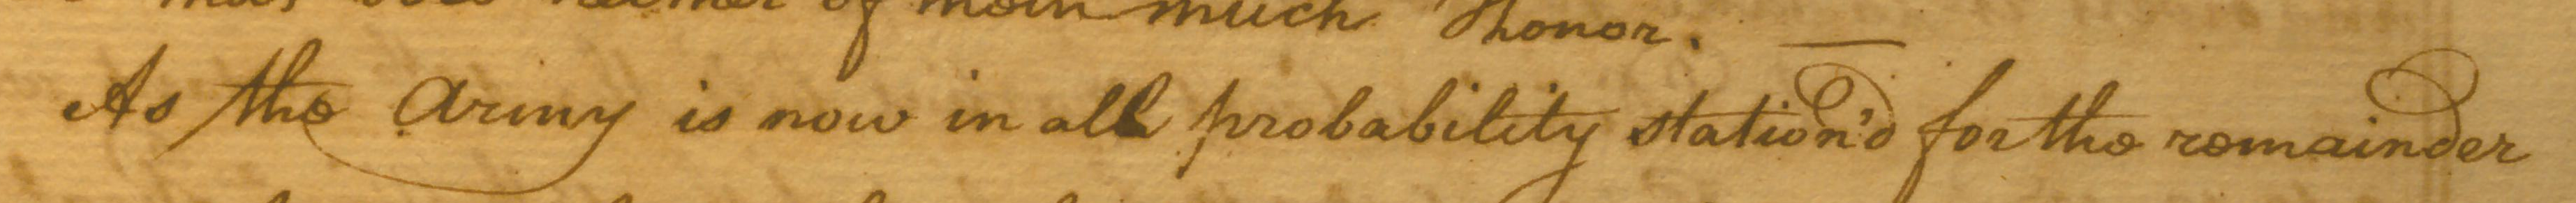As the army is now in all probability station'd for the remainder
